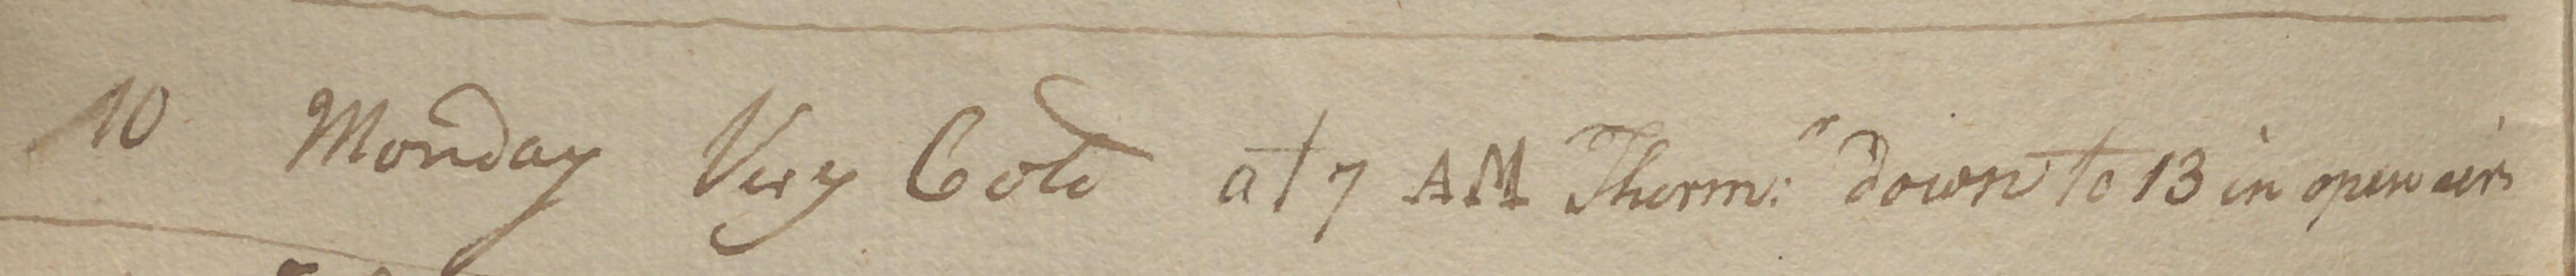10 Monday Vesy Cold at 7 AM Thermr: down to 13 in open air
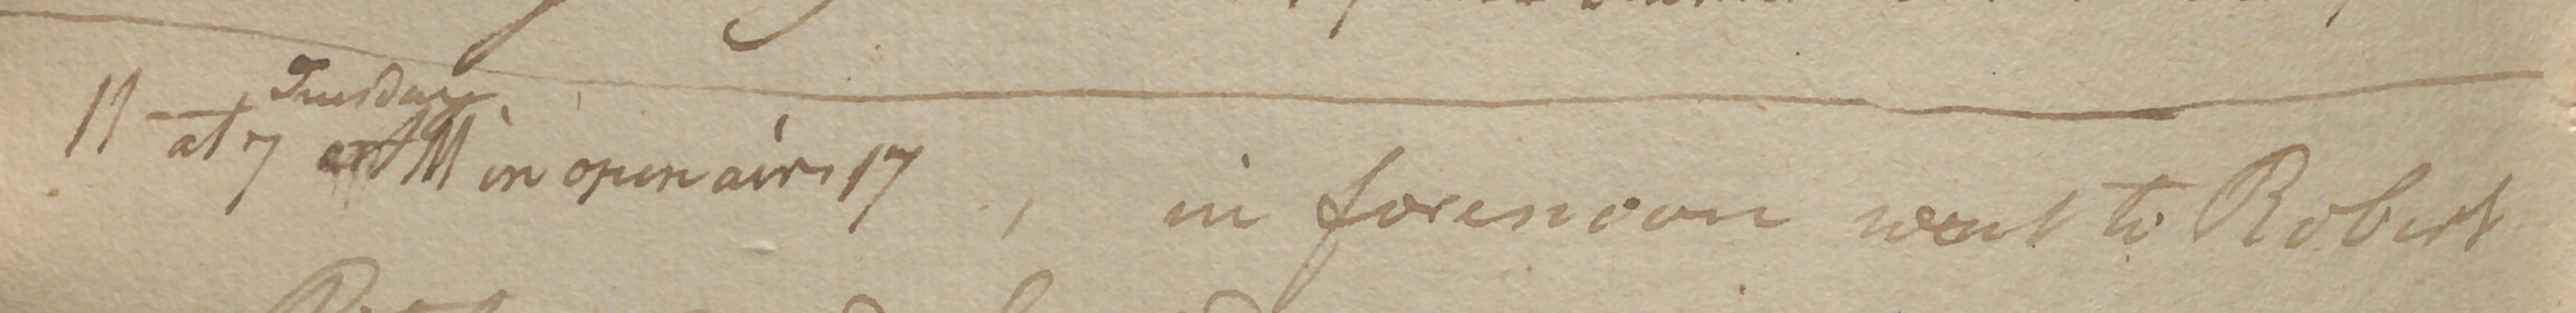11 at 7 AM in open air 17, in forenoon went to Robert
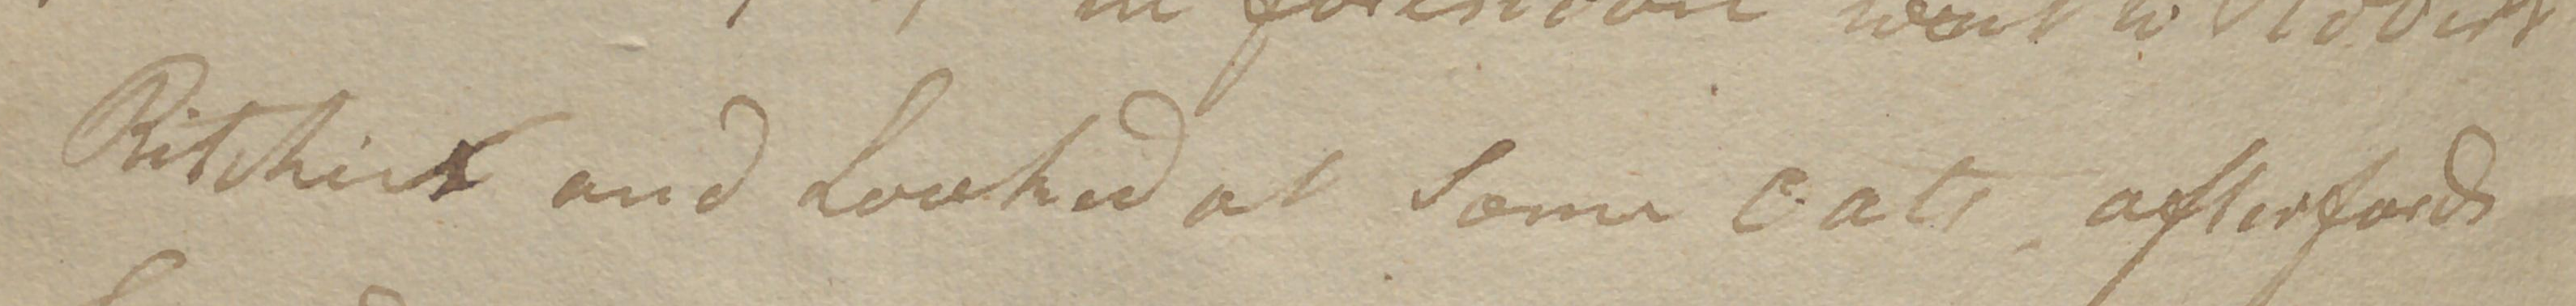Ritchies and Looked at some Cats afterfords
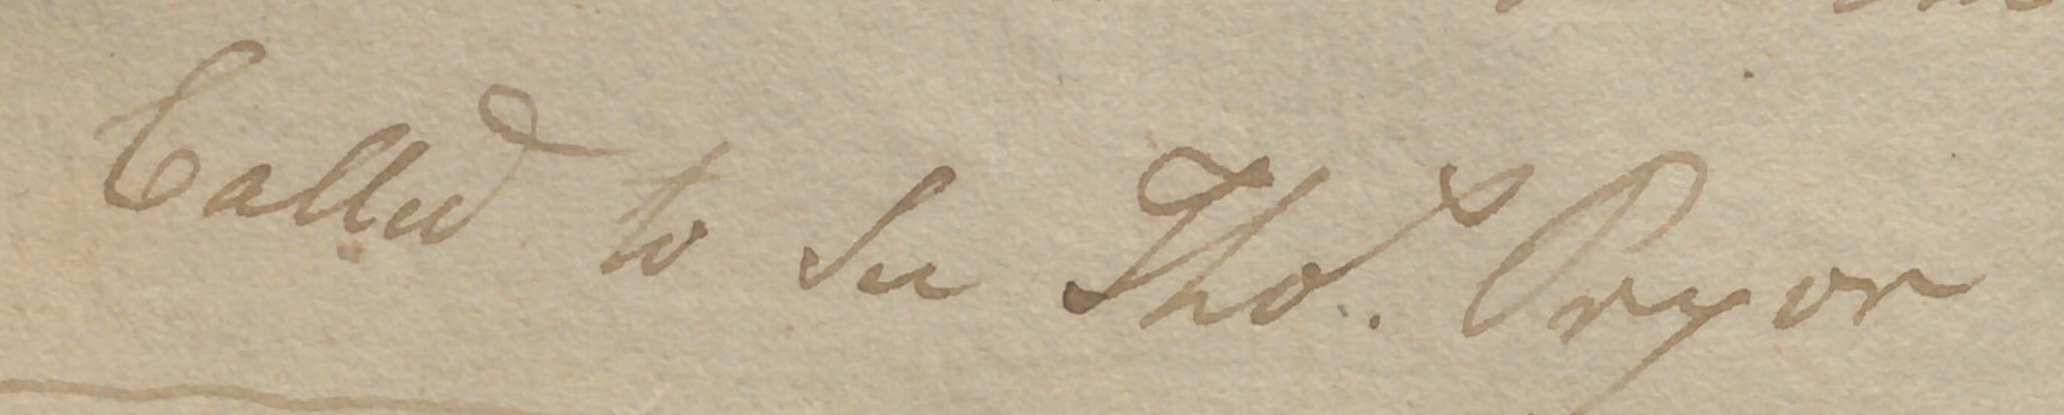Called to see Tho^s. Pryor
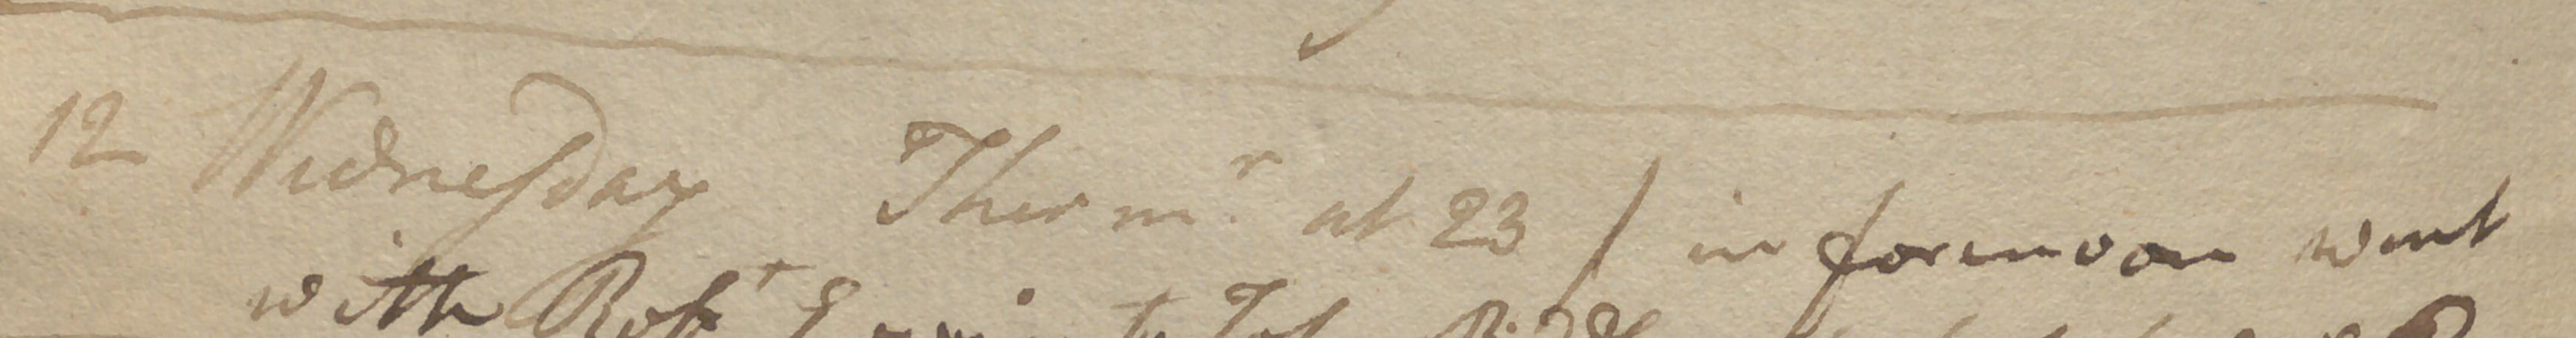2 Wednesday Therm^r. at 23 / in forenoon went
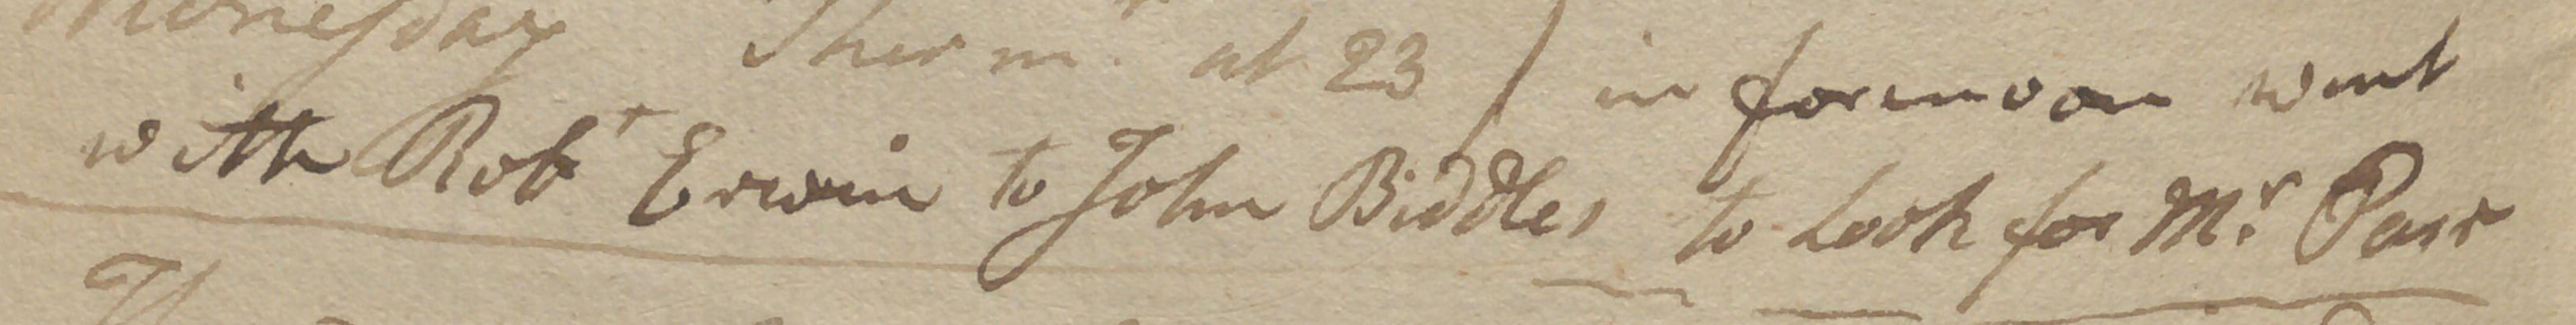with Rob^t Erwin to John Biddles to Look for M^r. Parr
